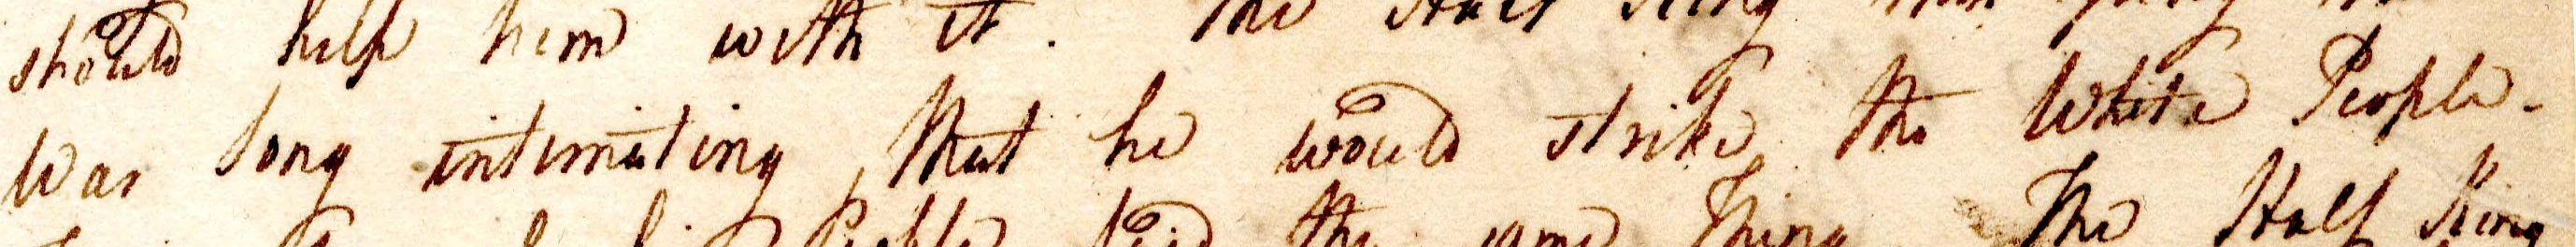War Song intimating that he would strike the White People.
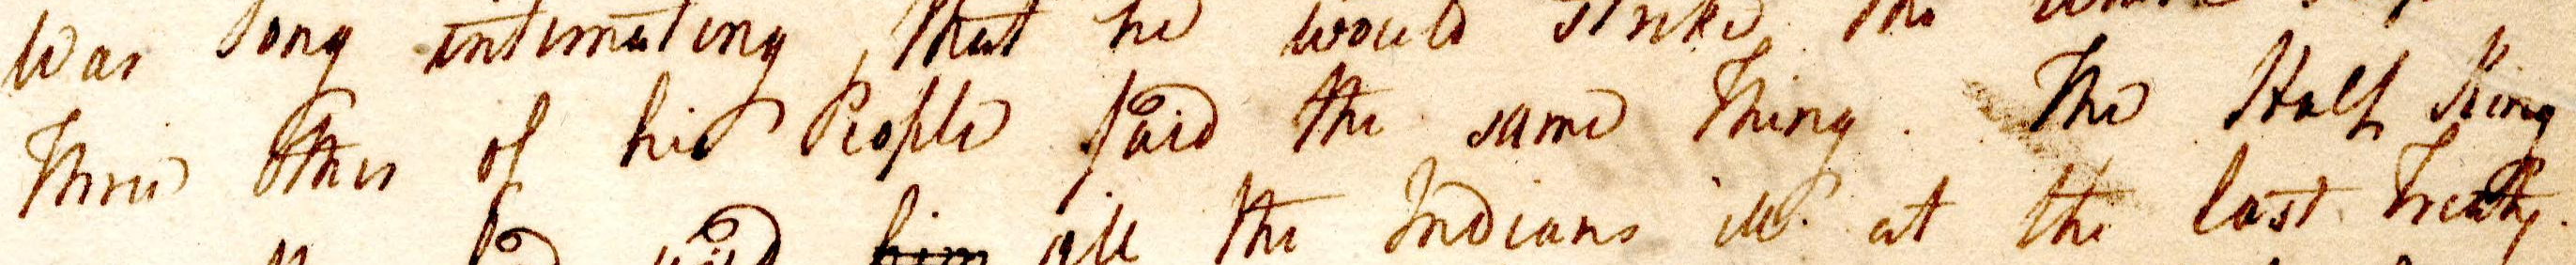Three Other of his People said the same Thing. The Half King
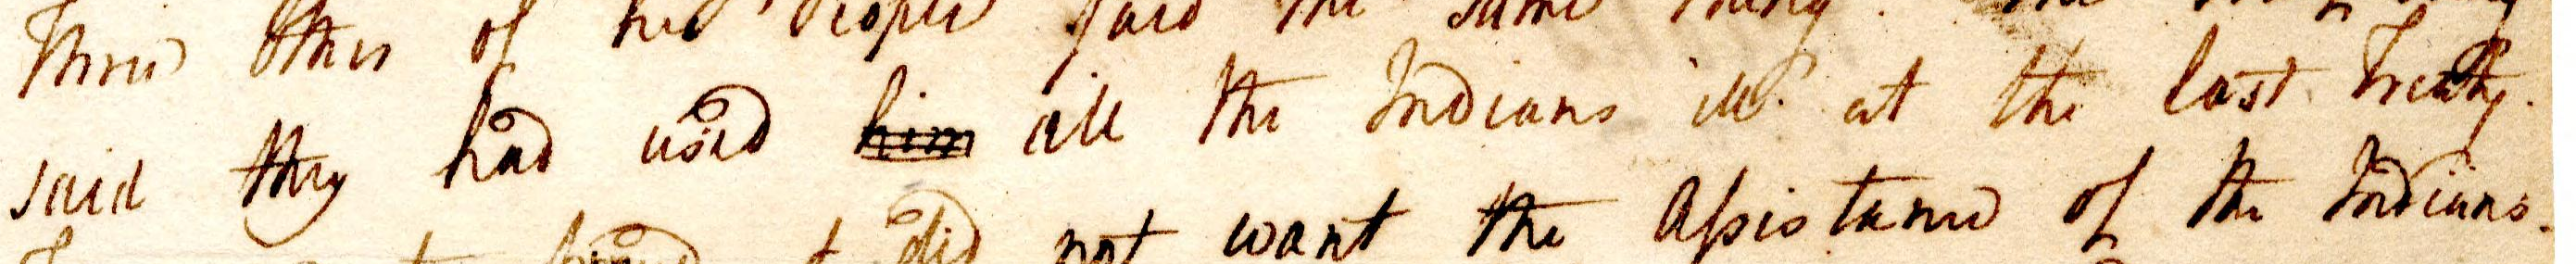said they had used him all the Indians ill at the last Treaty.
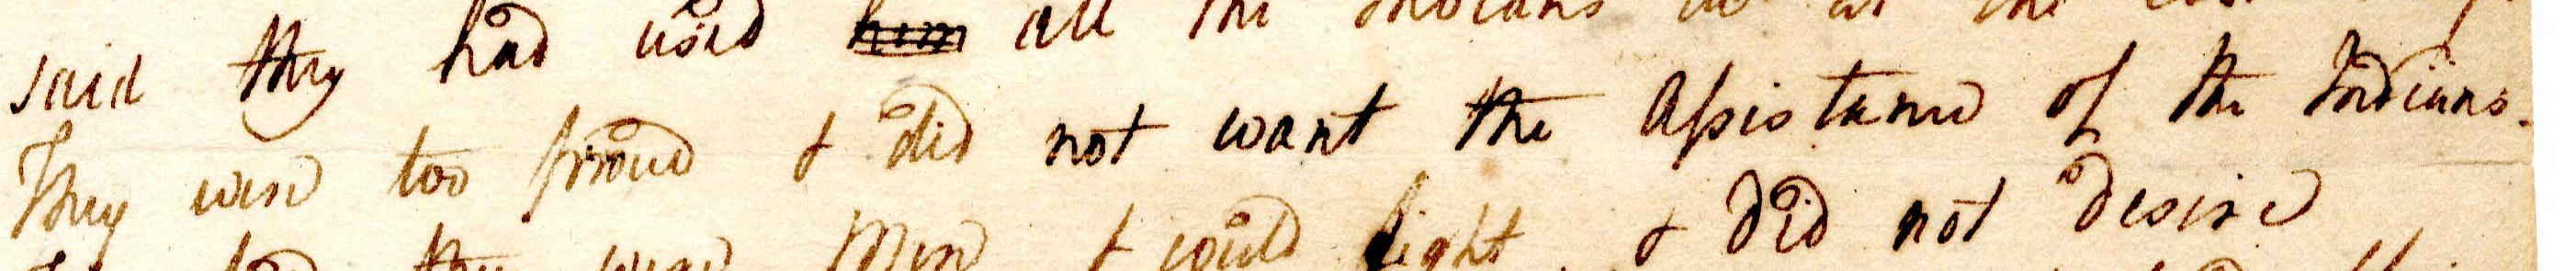They were too proud & did not want the Assistance of the Indians.
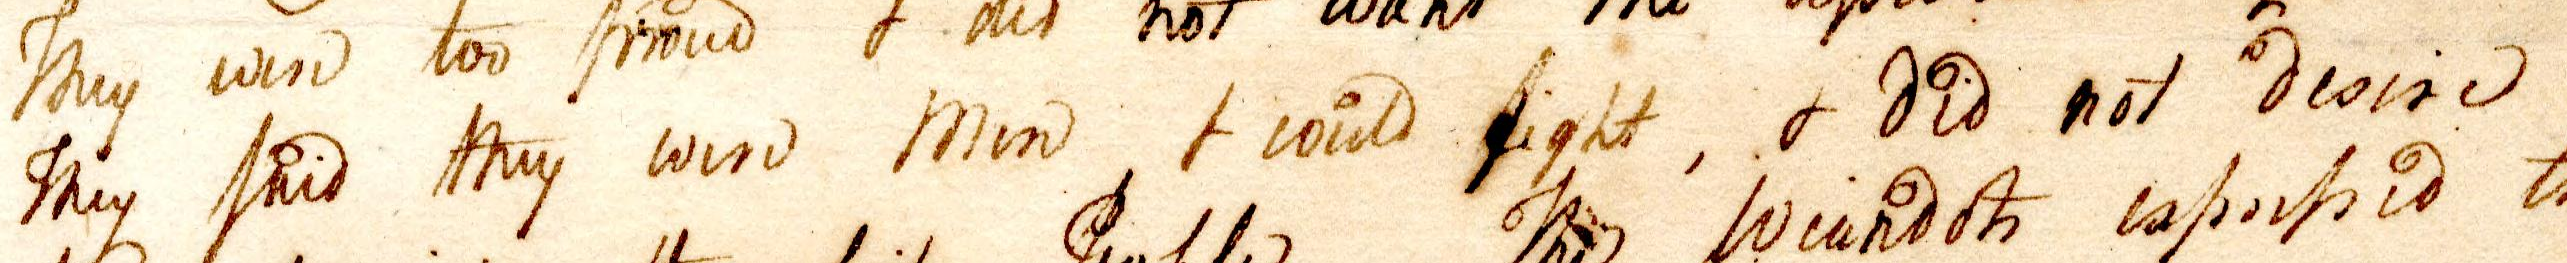They said they were Men & could fight, & did not desire
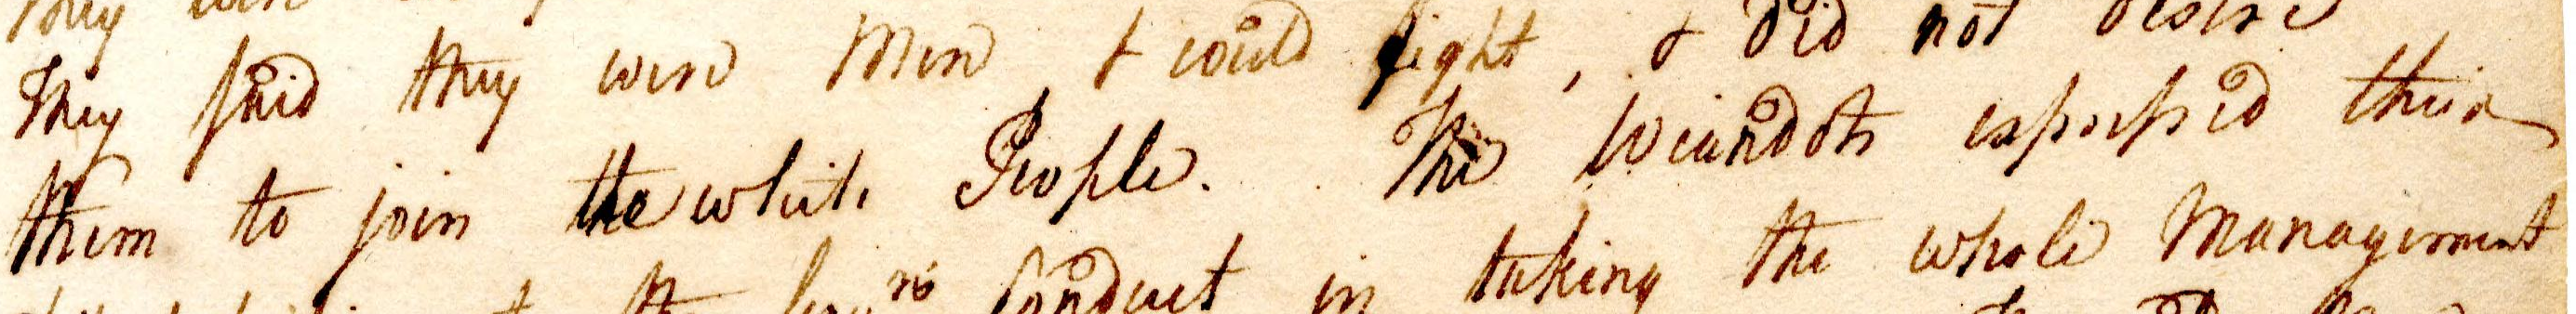them to join the white People. The Wiandots espoused their
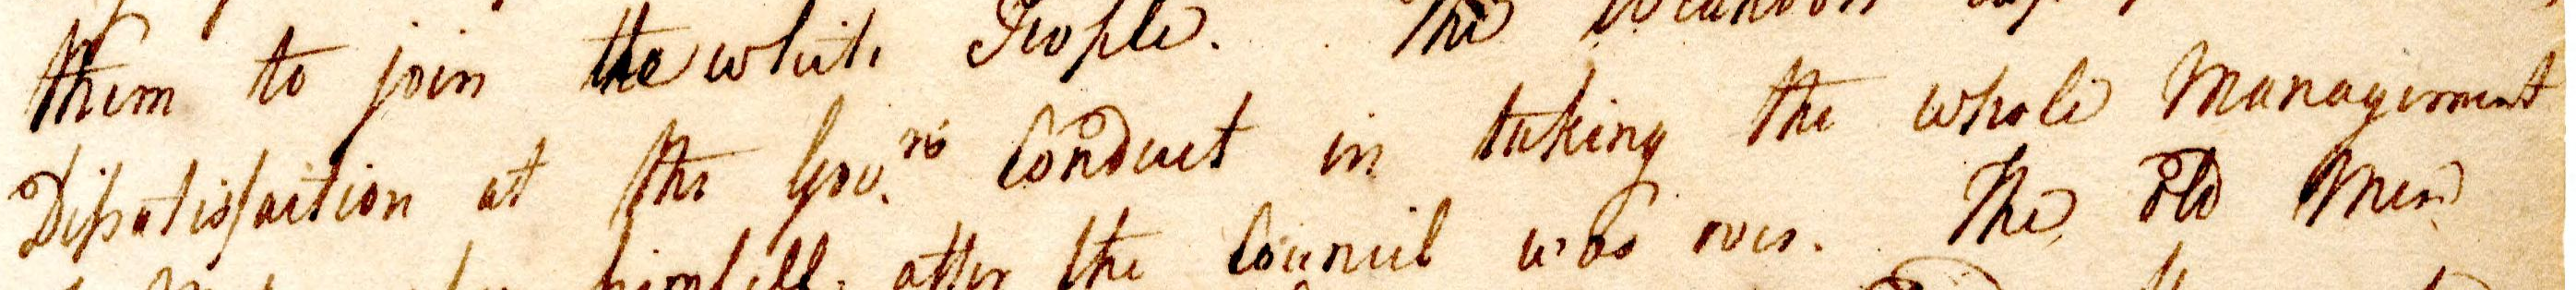Dissatisfaction at the Gov^r. Conduct in taking the whole Management
